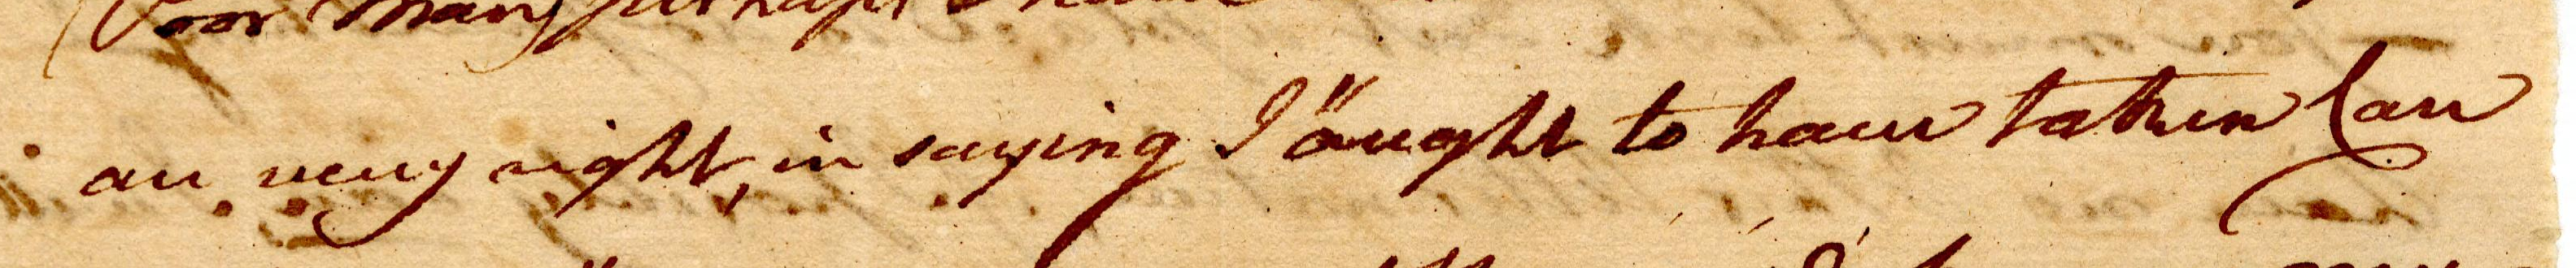are very right, in saying I "ought to have taken Care
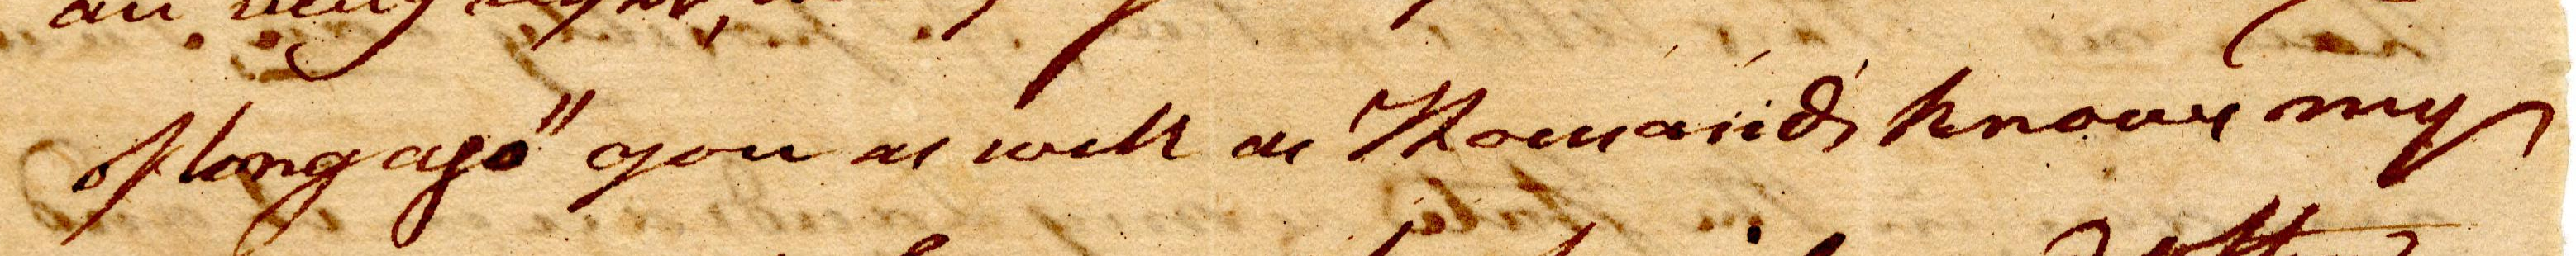of long ago" you as well as Thousands knows my
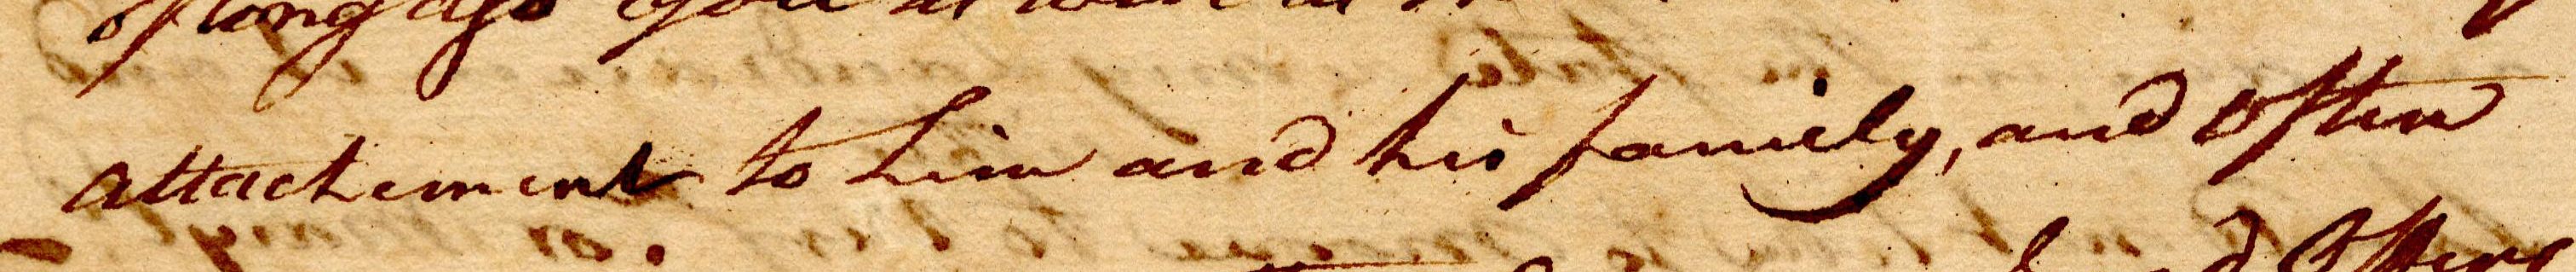attachment to him and his family, and Often
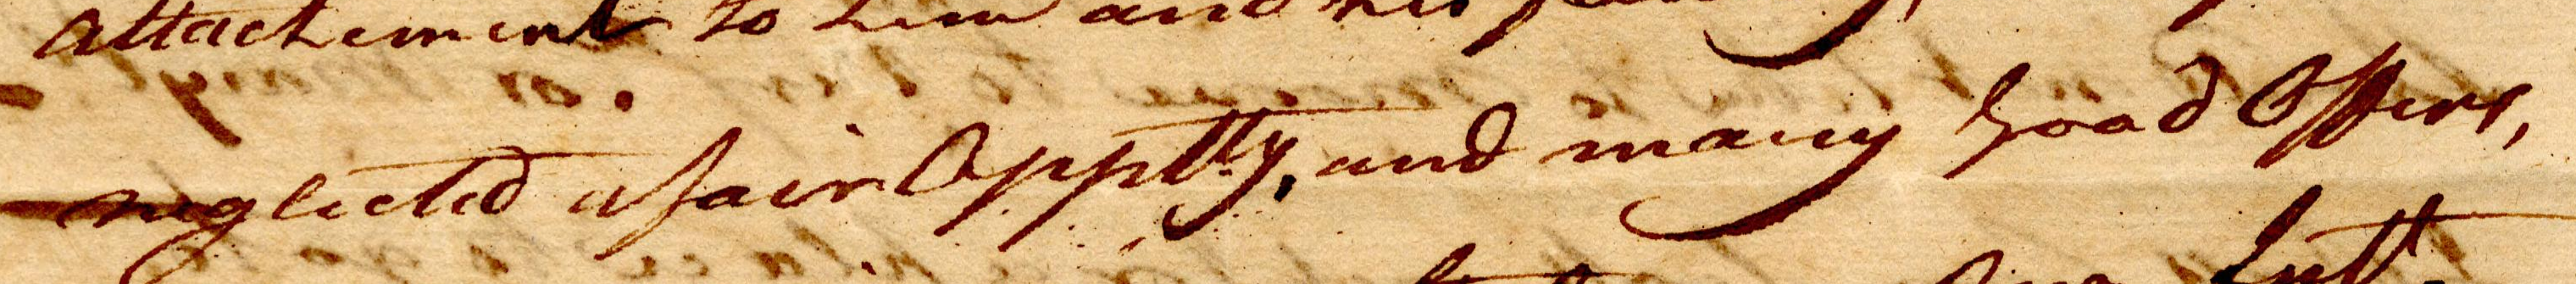neglected a fair Opp^ty, and many Good Offers,
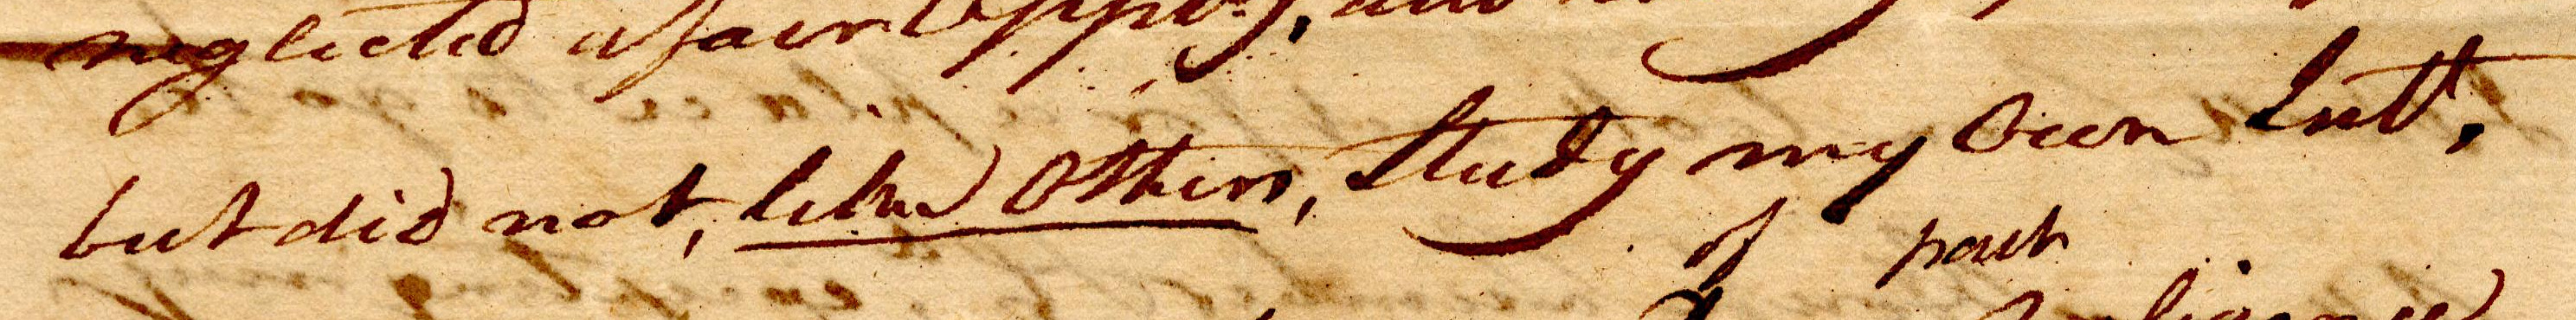but did not, like Others, Study my own Lot^t.
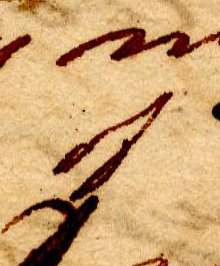of
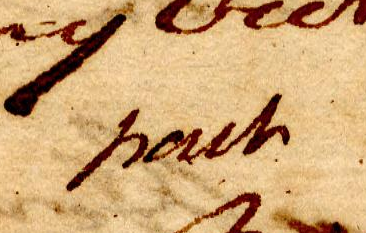past
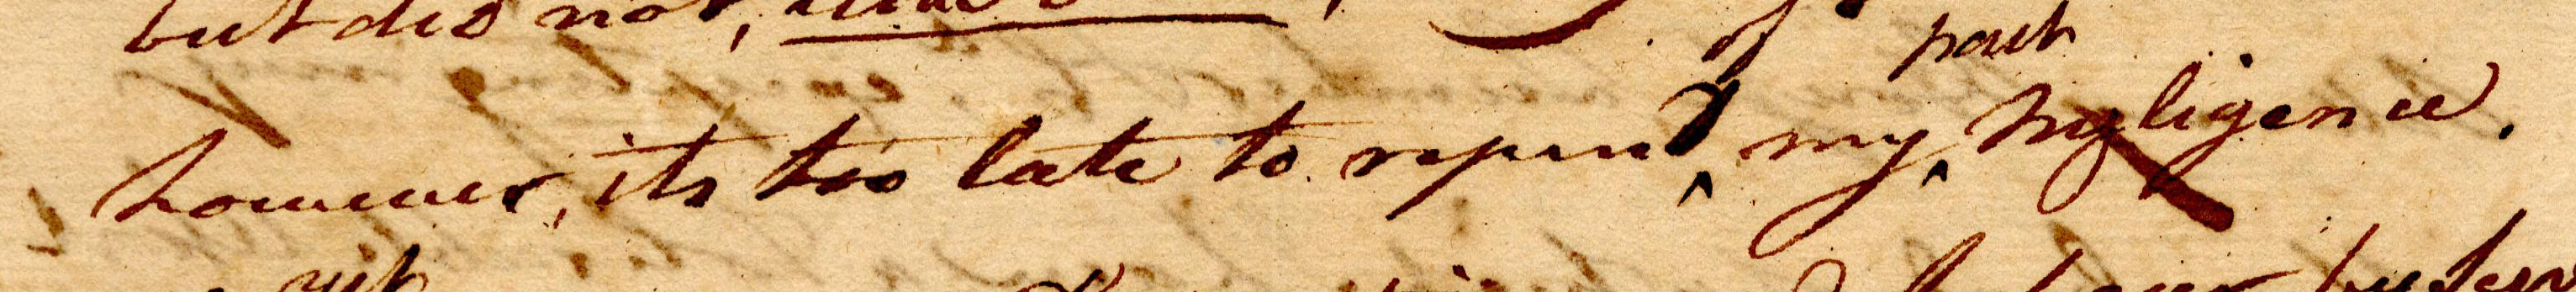however, its too late to repend ^ my ^ negligence.
